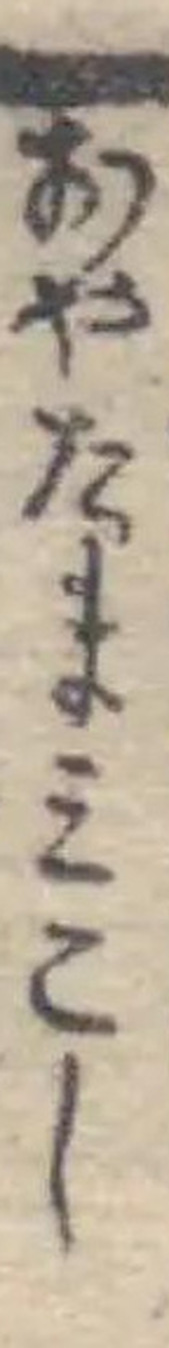おやたまみこし
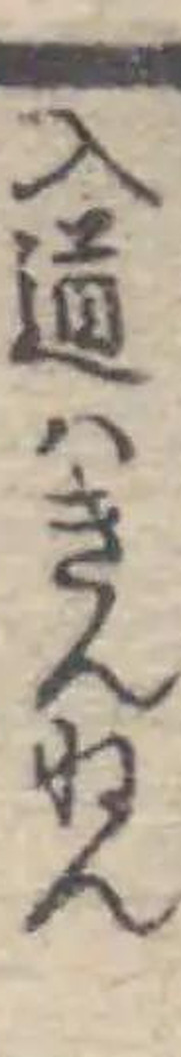入道はきんねん
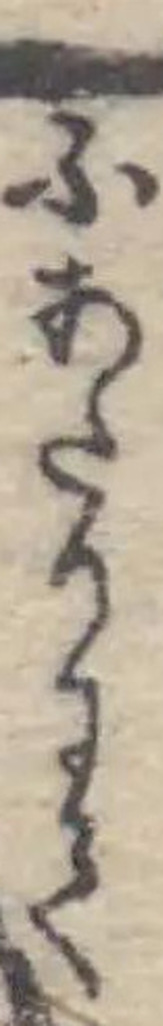ふあたりにて
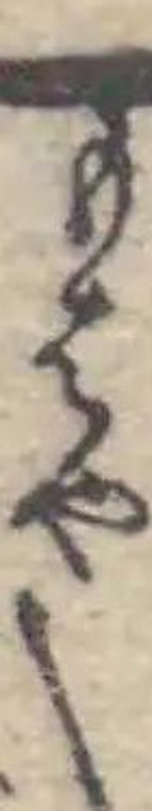もはや
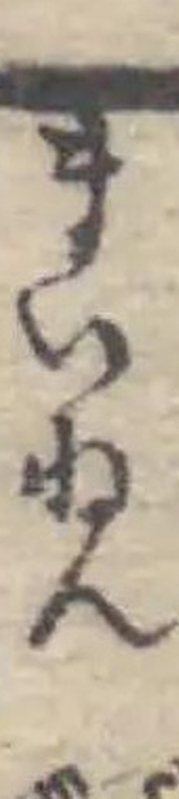まいねん
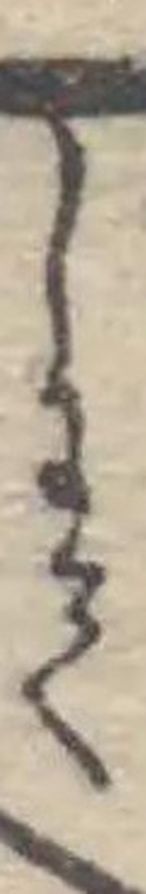しにて
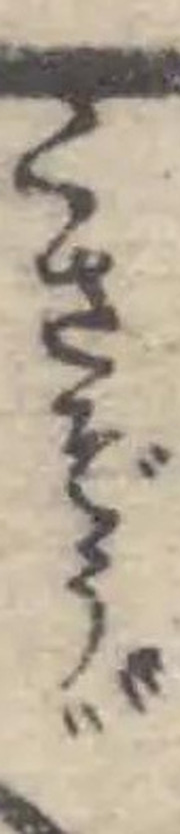くさぞう
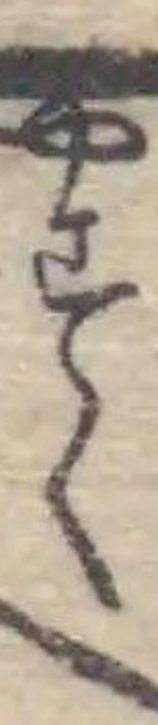やすく
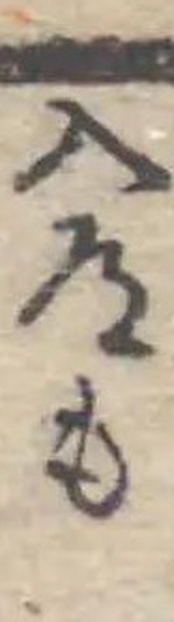入道も
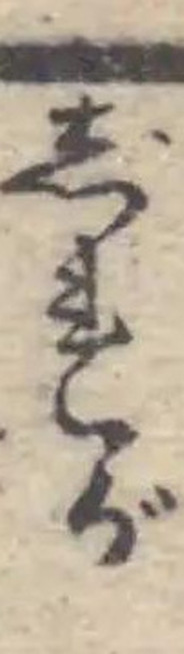しれが
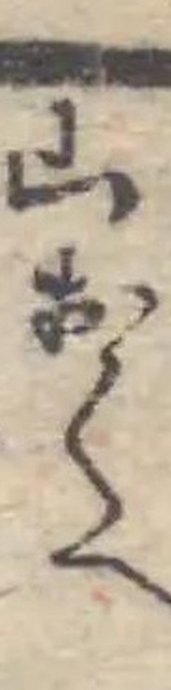山おくへ
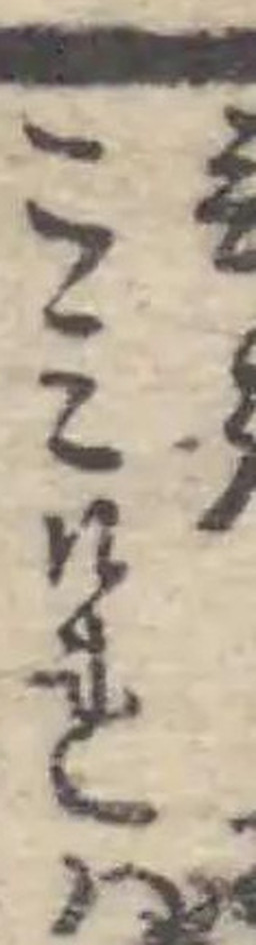こみけれは
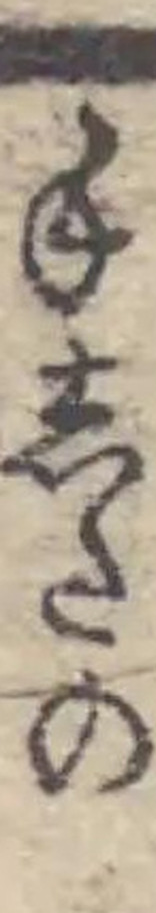手したの
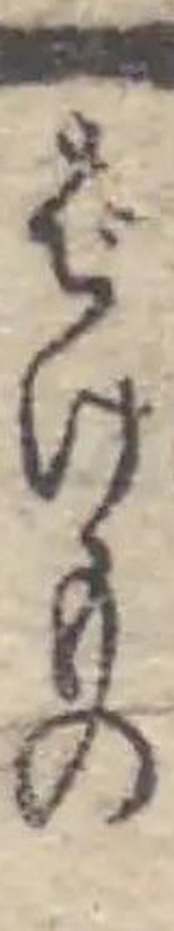ばけもの
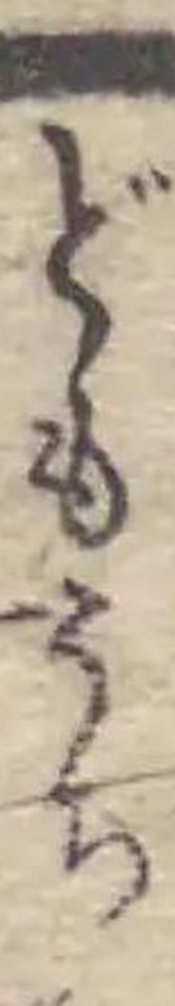どもうち
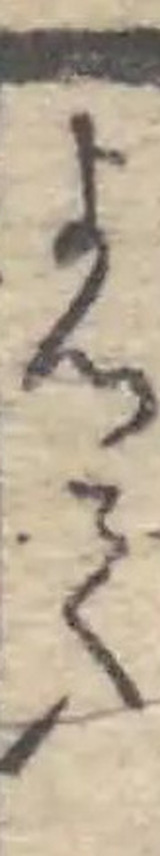よつて
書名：作意妖恐懼感心 2巻
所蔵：国立国会図書館 National Diet Library, JAPAN
